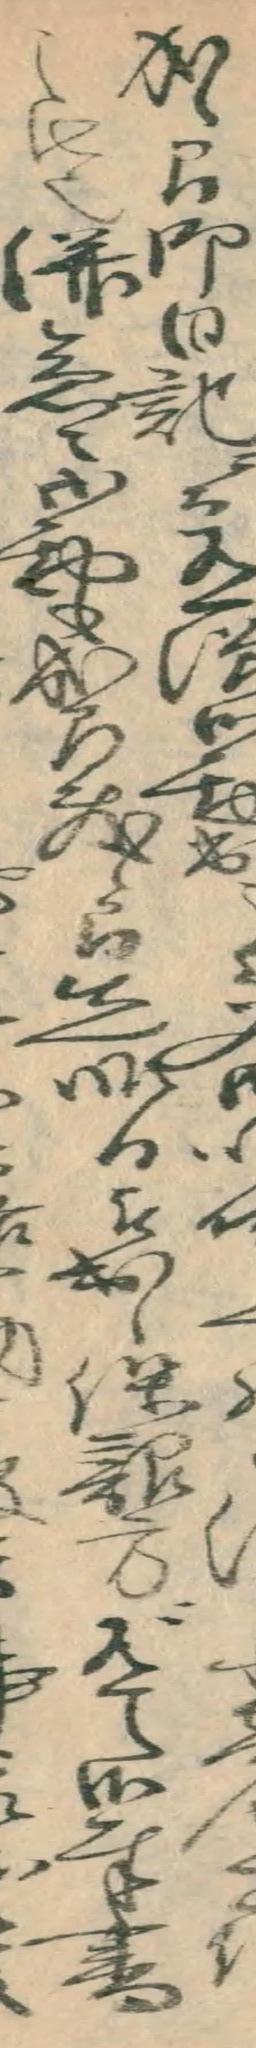之由也併急々御勘も成間敷候間先昨日被出候保韶方ニ有之御奉書
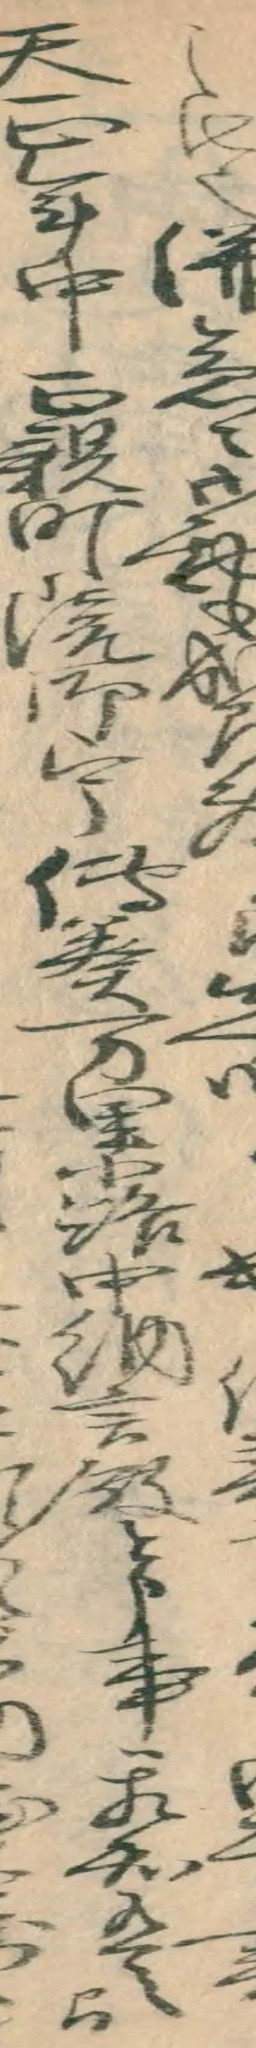天正年中正親町院御宇伝奏万里小路中納言殿と申事ハ相知有之候間
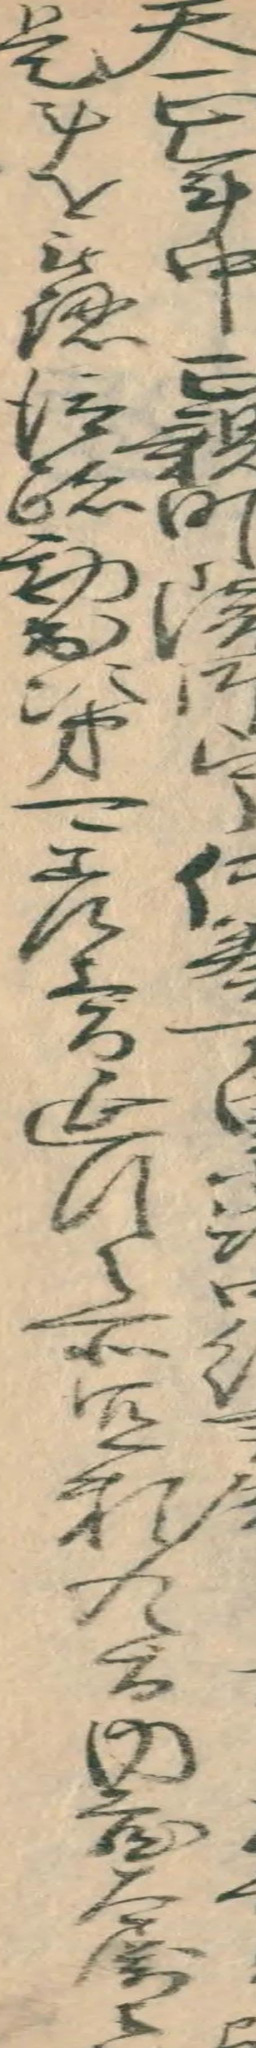是計を被認従跡勘出次第可差上旨延引之所宜頼入候旨内蔵大属迄
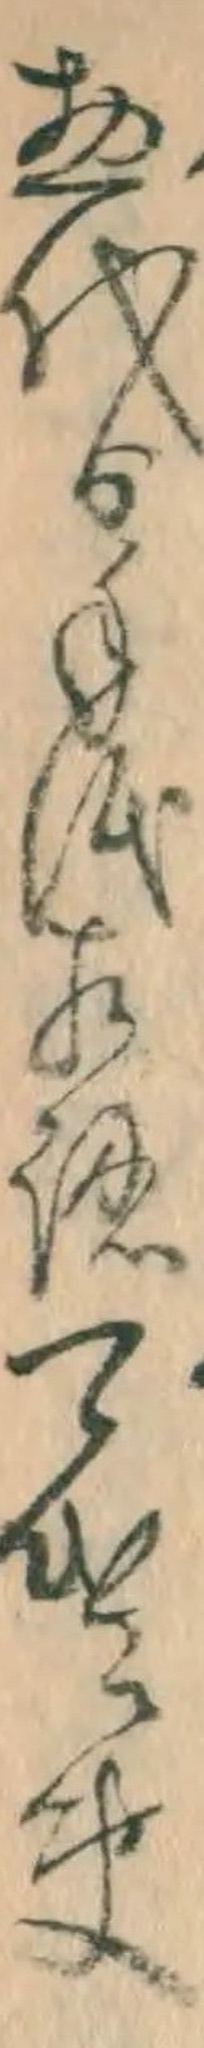惣代ゟ手紙相認可遣ニ決

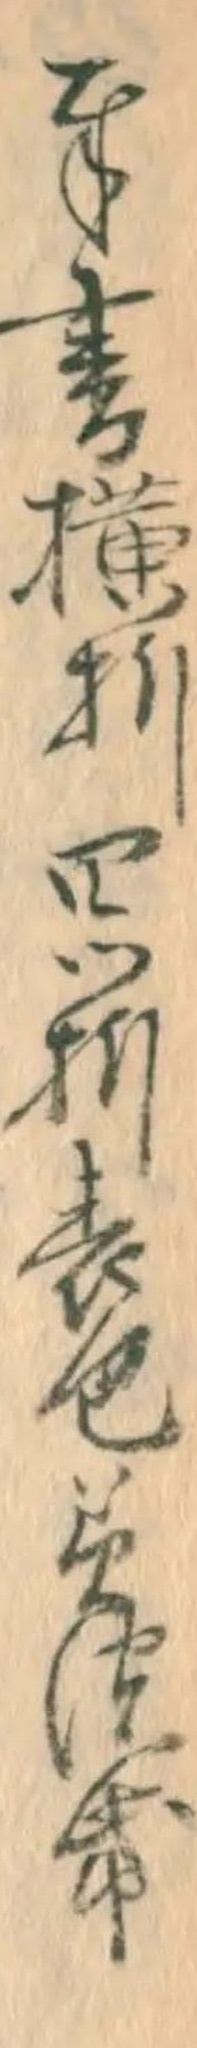奉書横折四ツ折表包美濃紙
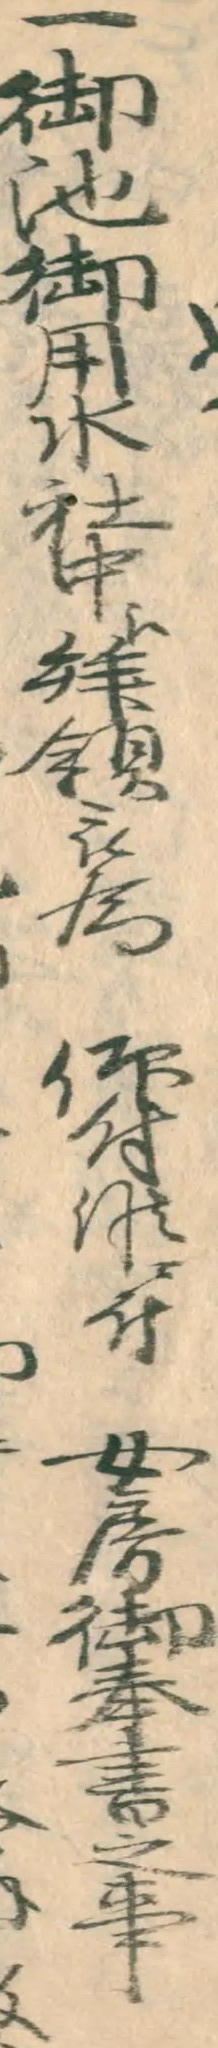一御池御用水社中江拝領被為仰付候ニ付女房御奉書之事
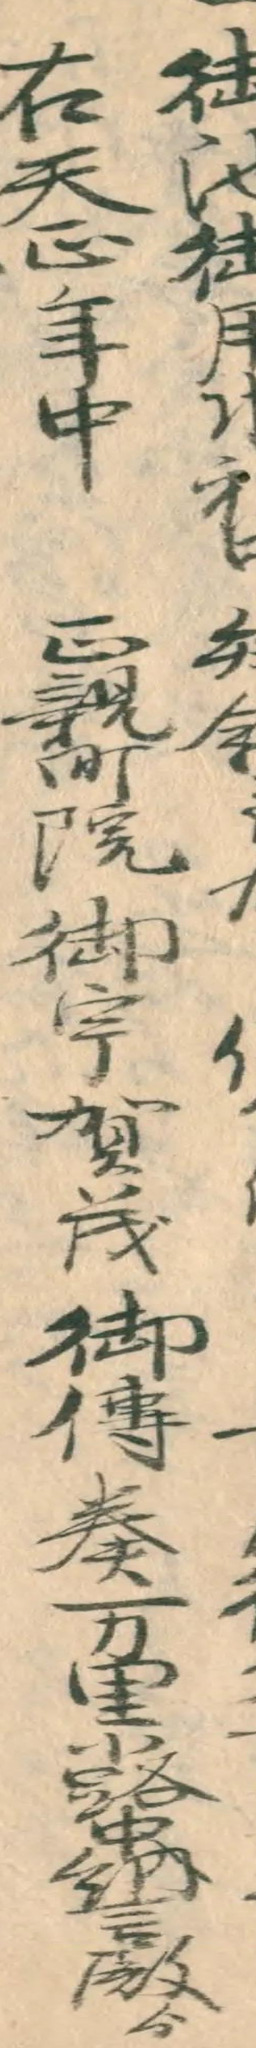右天正年中正親町院御宇賀茂御伝奏万里小路中納言殿ゟ
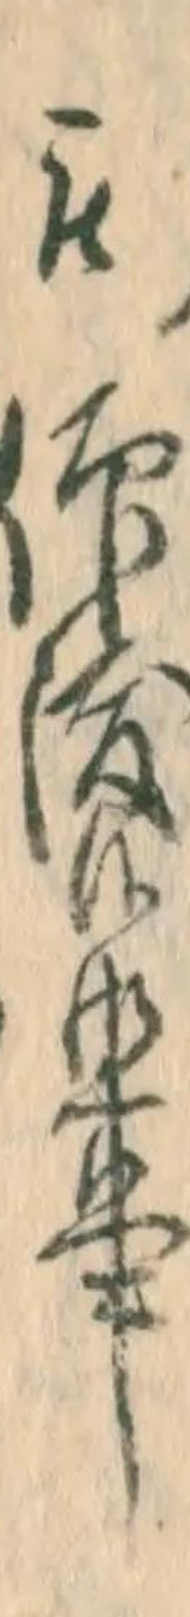被仰渡候御事
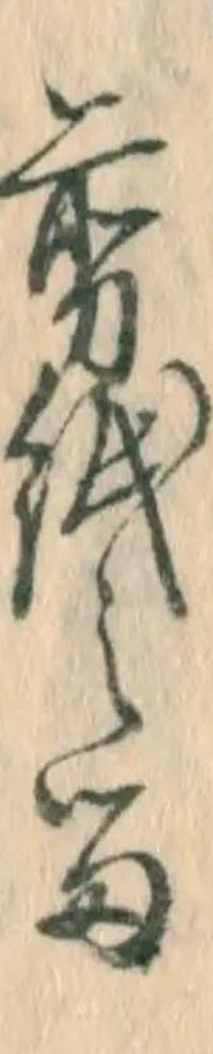剪紙之留
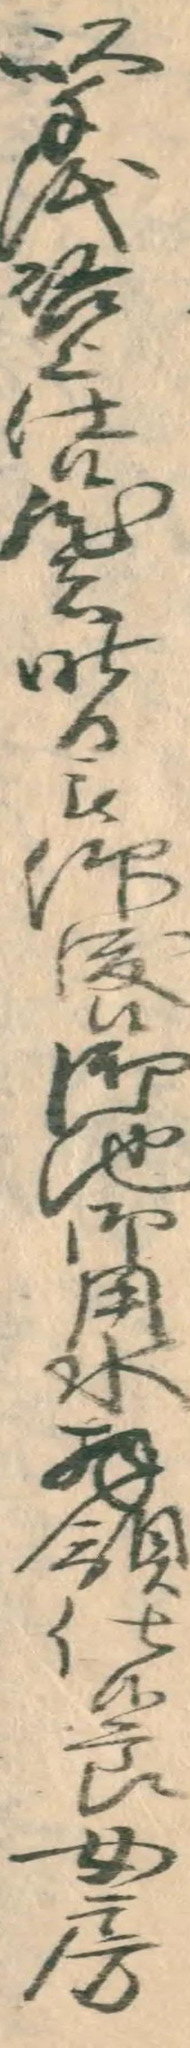以手紙啓上仕候然者昨日被仰渡候御池御用水拝領仕候節女房
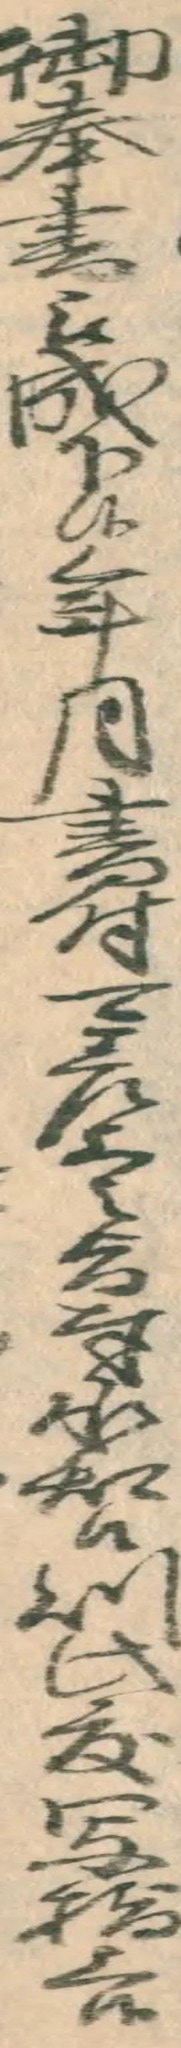御奉書被成下候年月書付可差上之旨承知候則此度写指上候
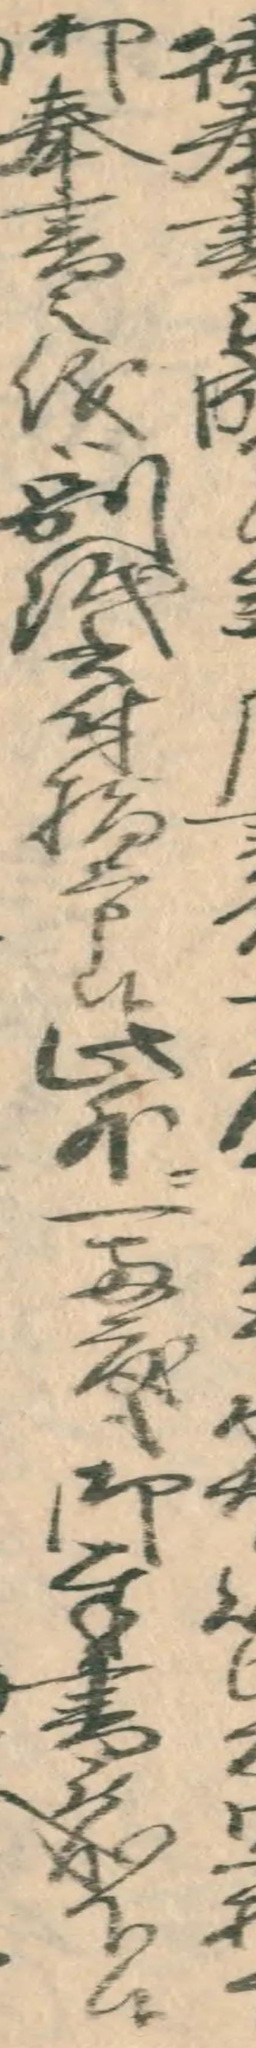御奉書之儀ハ別紙書付指上申候此外ニ一両度も御奉書被成下候
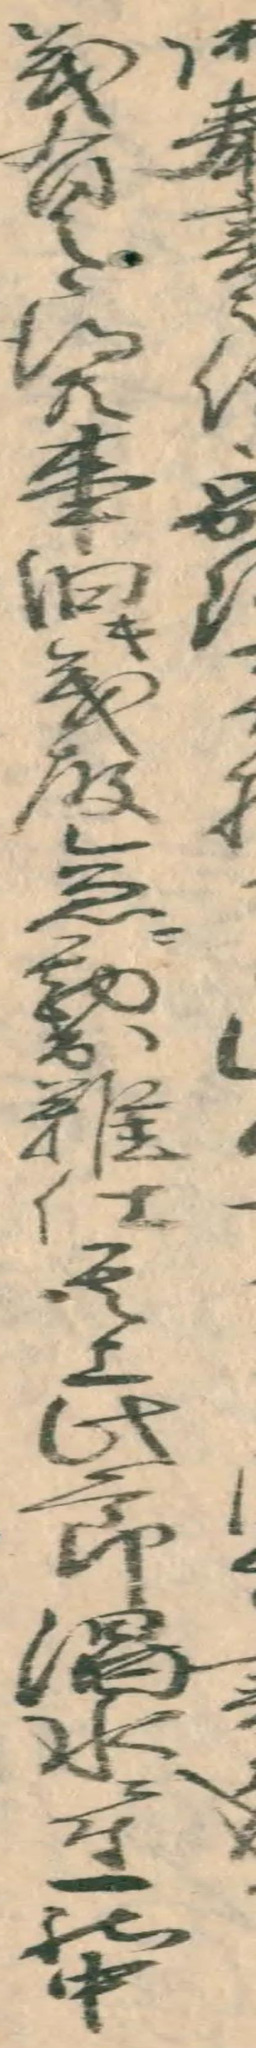義有之候得共事旧キ義故急ニ勘出難仕其上此節渇水ニ付一社中
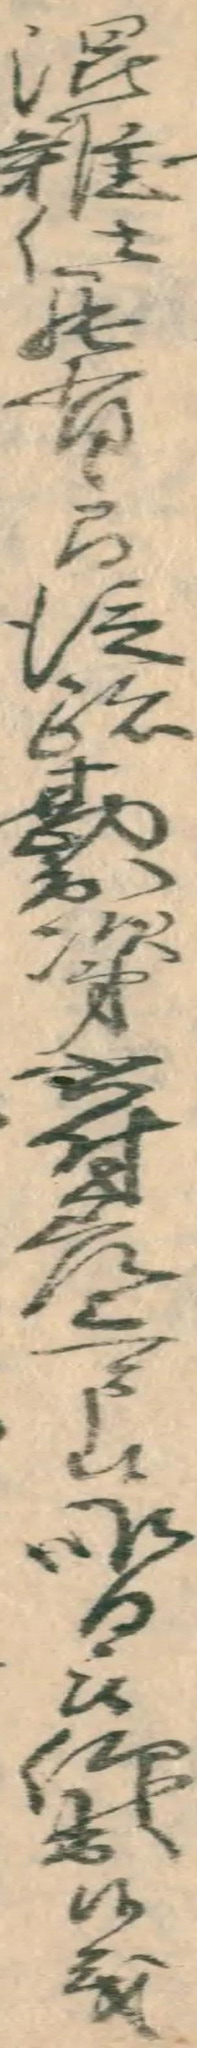混雑仕罷有候間従跡勘出次第書付差上可申候昨日被仰出候義
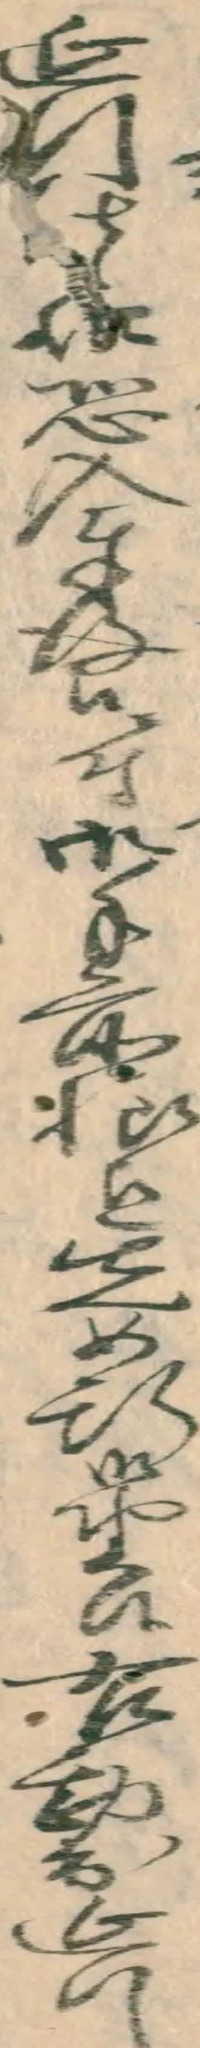延引仕候処恐入奉存候ニ付御手前様迄先如斯御座候右勘出延引
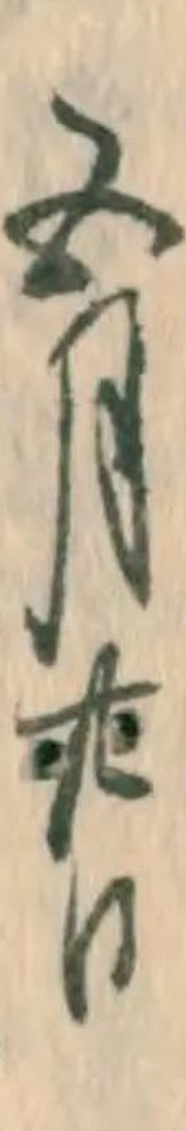五月廿日
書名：賀茂社記録. 第58冊
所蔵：国立国会図書館 National Diet Library, JAPAN
